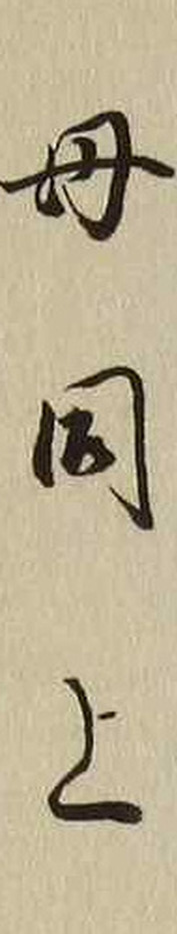母同上
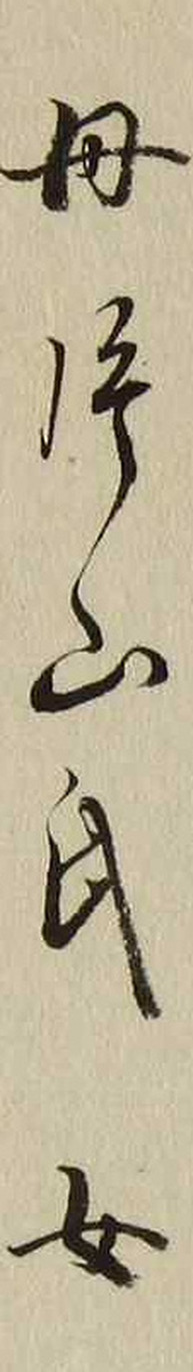母片山氏女
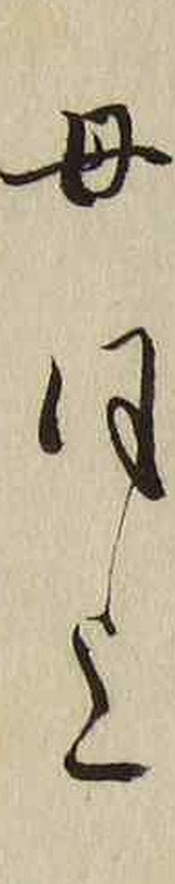母同上

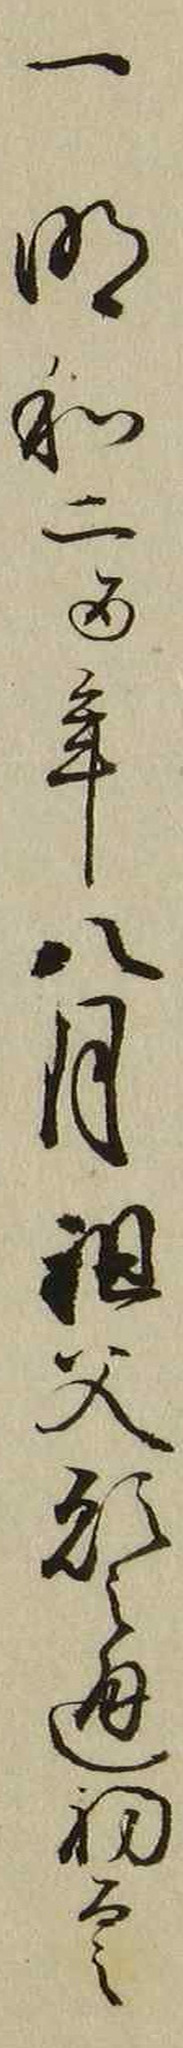一明和二酉年八月祖父願之通初而之
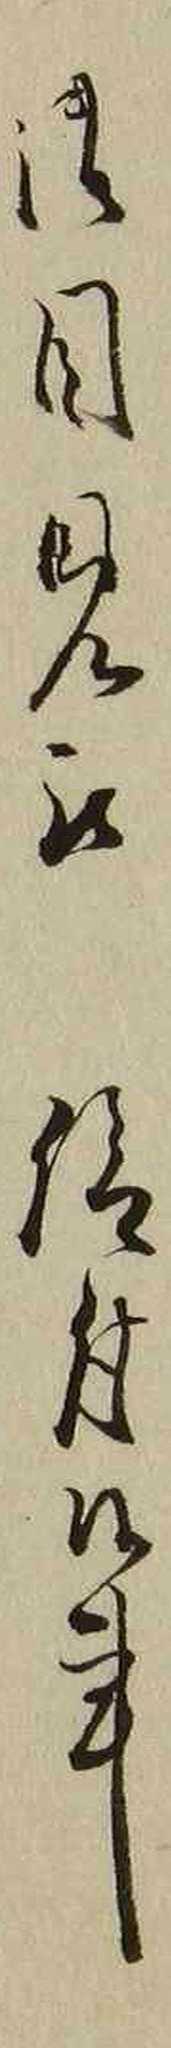御目見被仰付候事
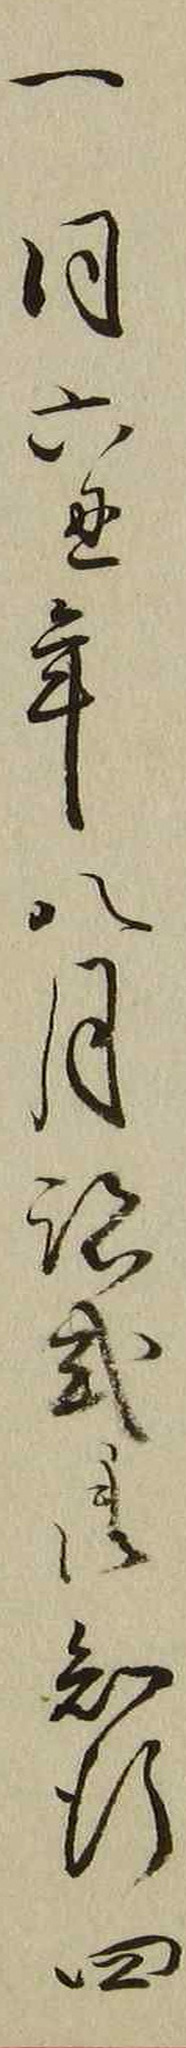一同六丑年八月跡式御知行四
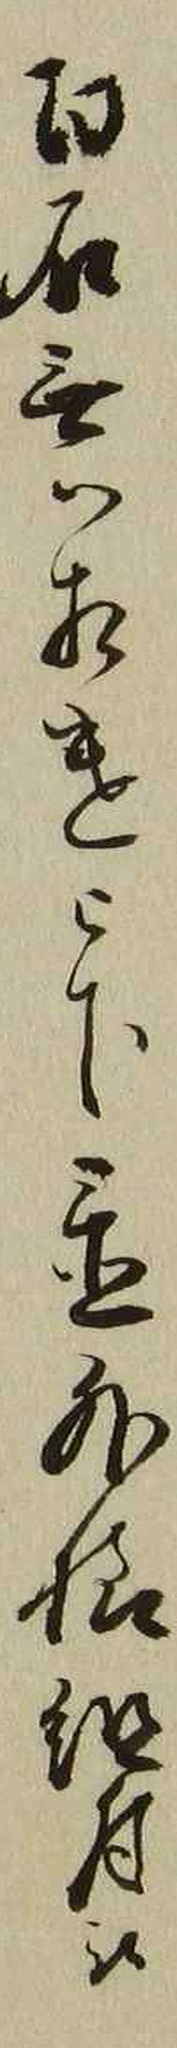百石無御相違被下置外様組付被
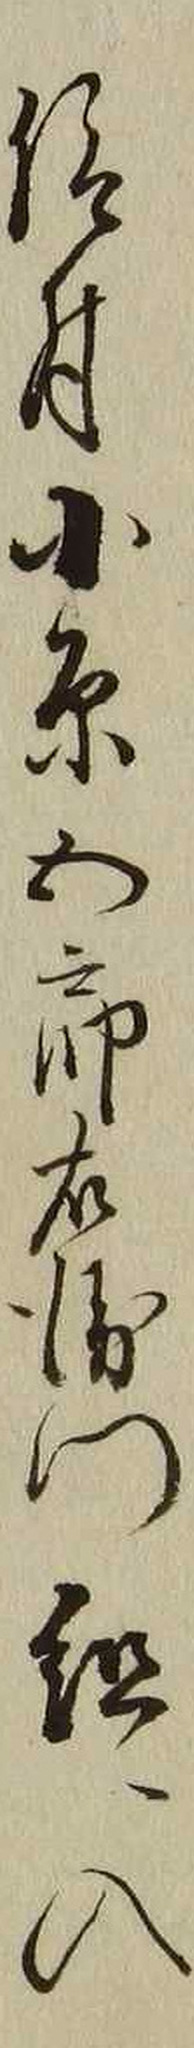仰付小原五郎右衛門組へ入
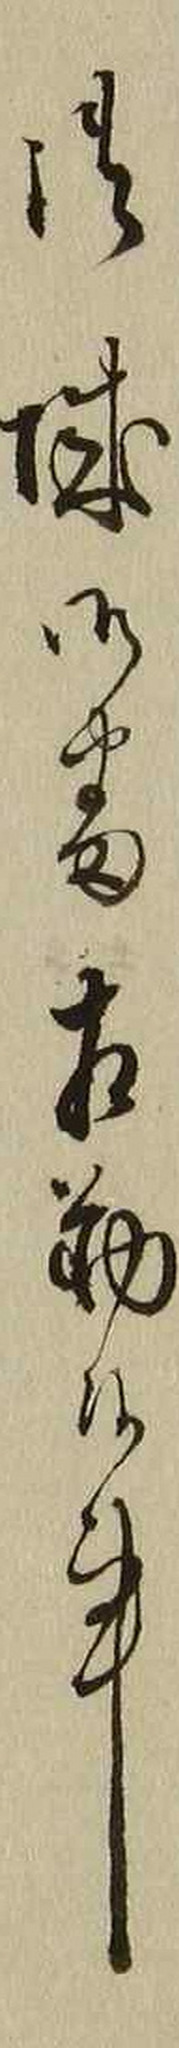御城御番相勤候事
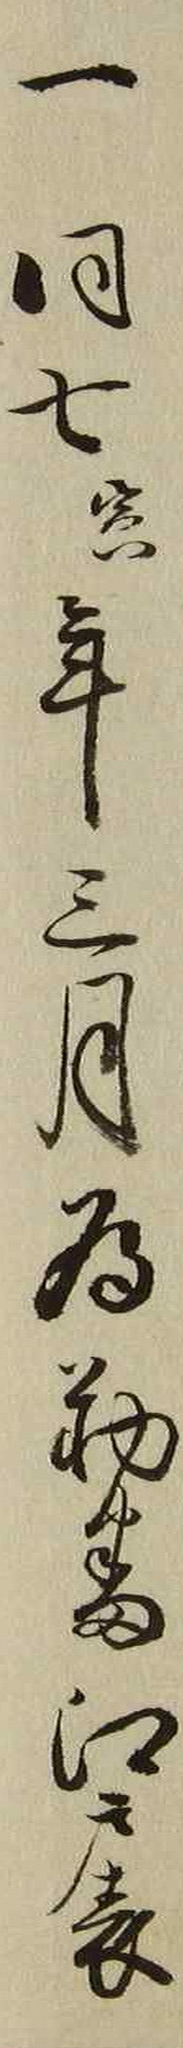一同七寅年三月為勤番江戸表
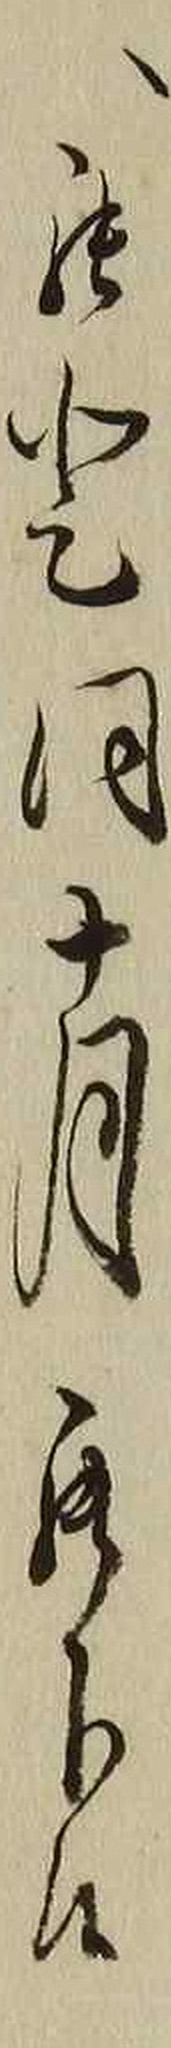へ罷登同十月罷下候
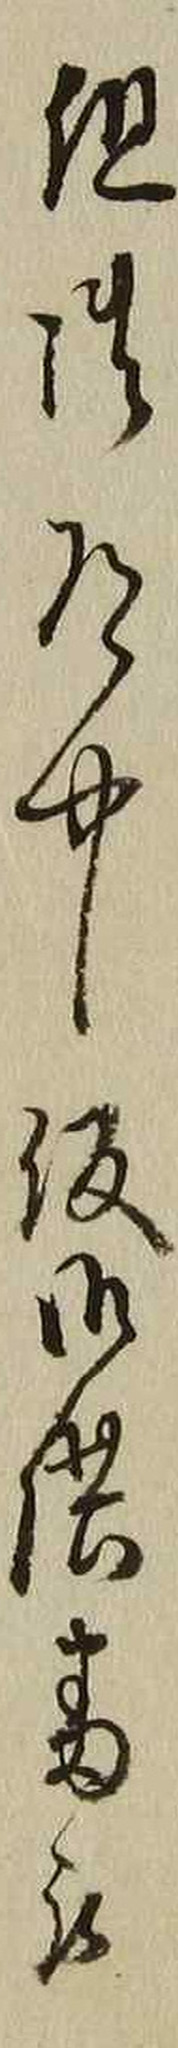但御道中仮御供番被
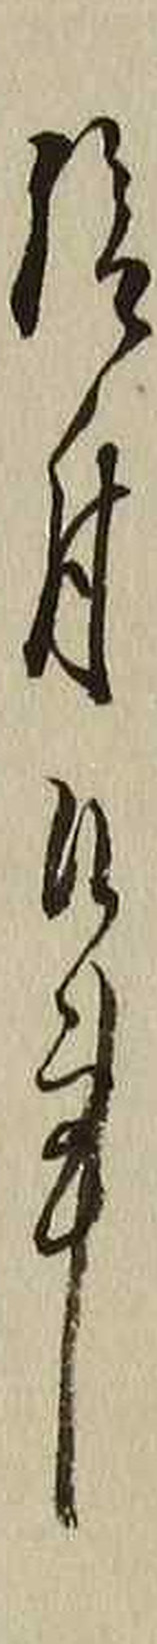仰付候事
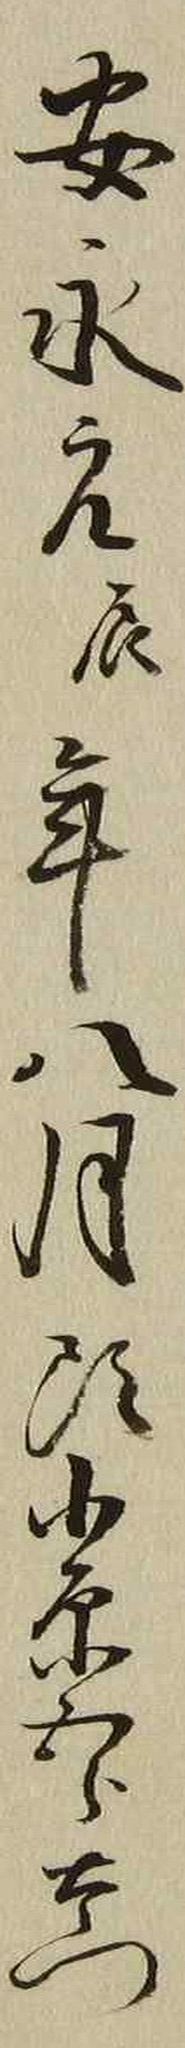安永元辰年八月頭小原五郎右衛門
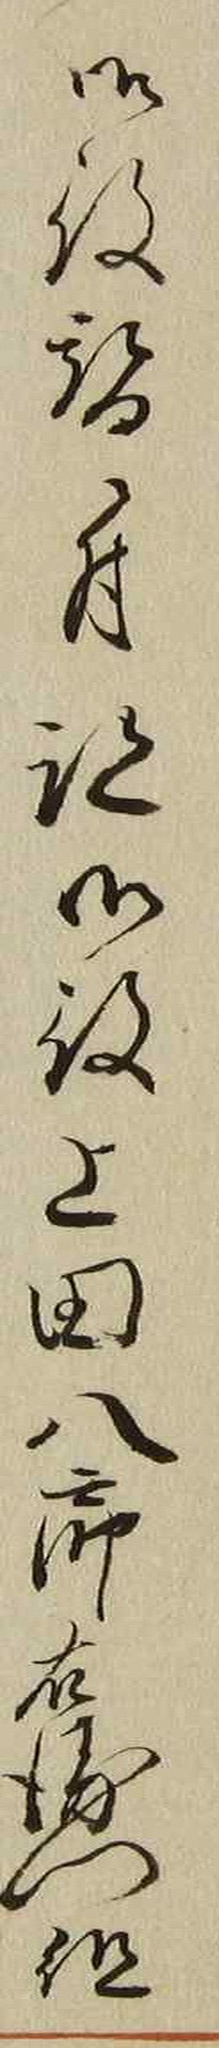御役替ニ付跡御役上田八郎右衛門組
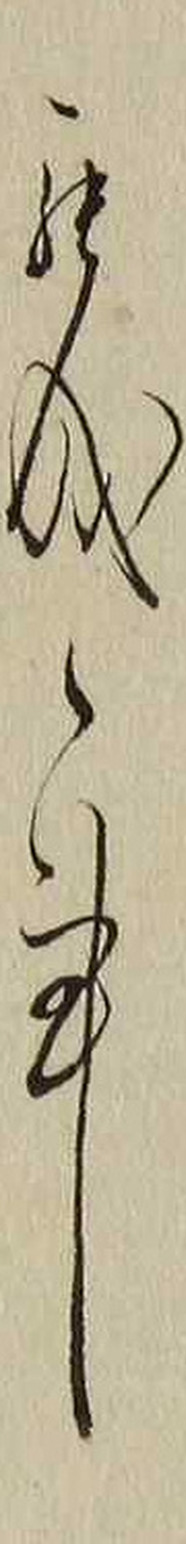罷成候事
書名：諸士系譜　巻之1　い之部1
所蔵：会津若松市立会津図書館
